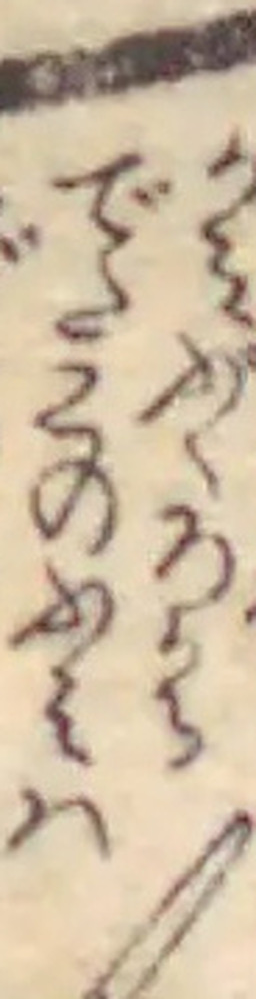でたこのふみは
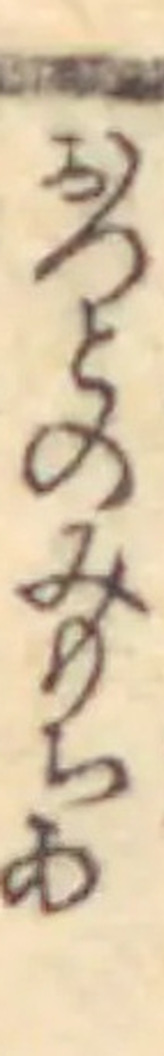おつとのみもちあ
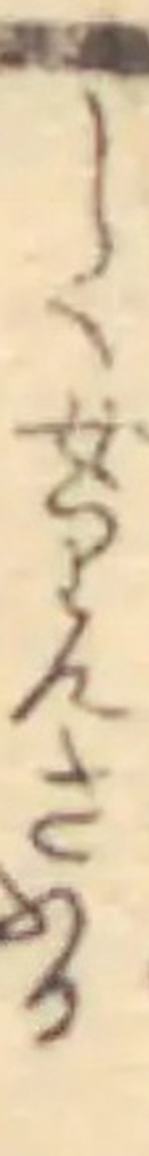しく女りんきふか
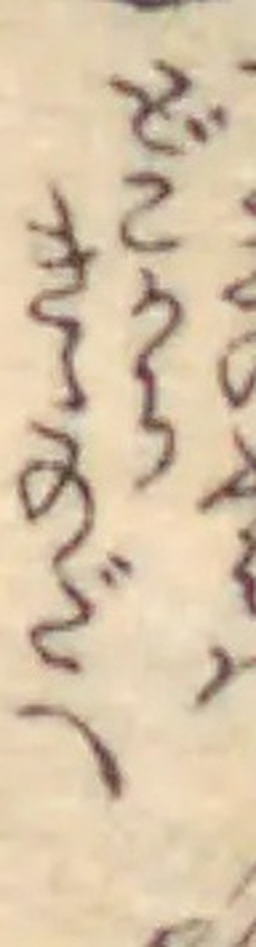きたのだへ
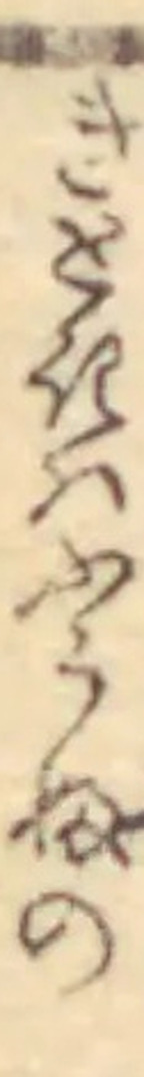きときはふうふの
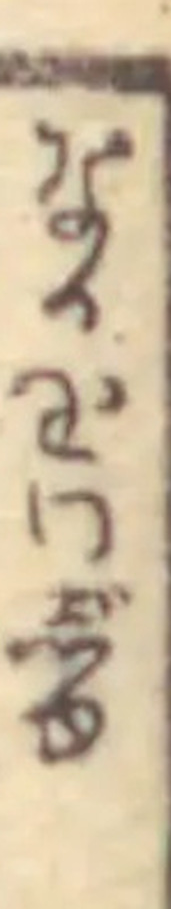なかをわじゆ
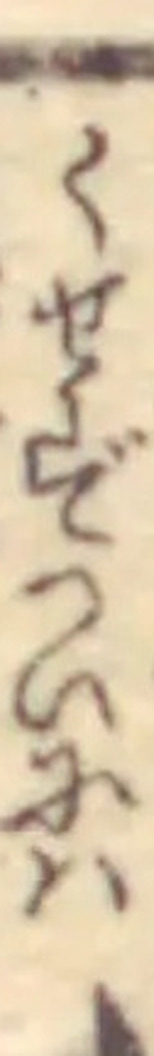くせずついには
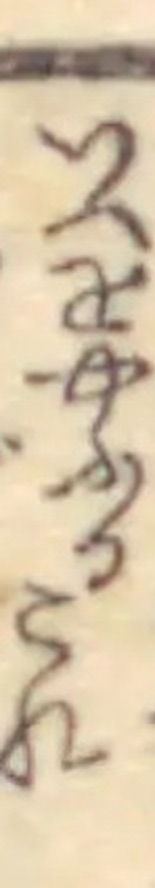いへをやふるこれ
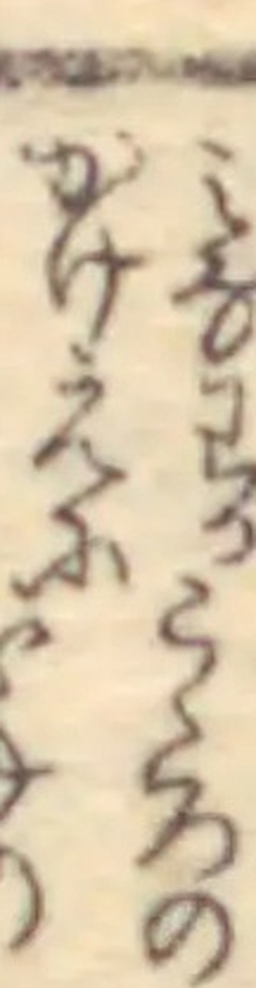かけえに
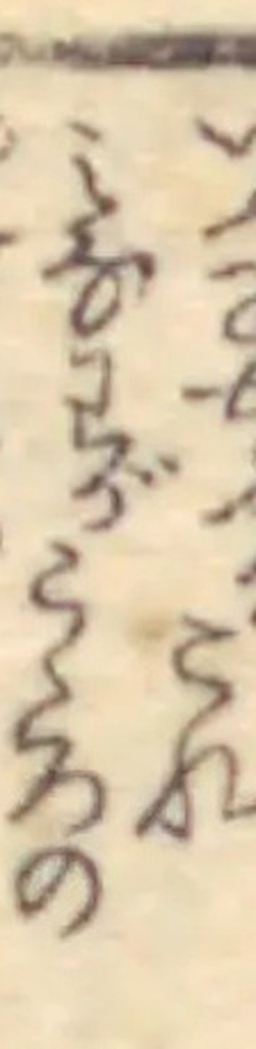みなわがこゝろの
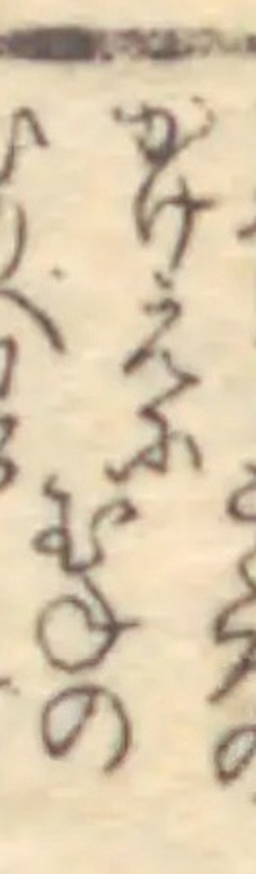むねの
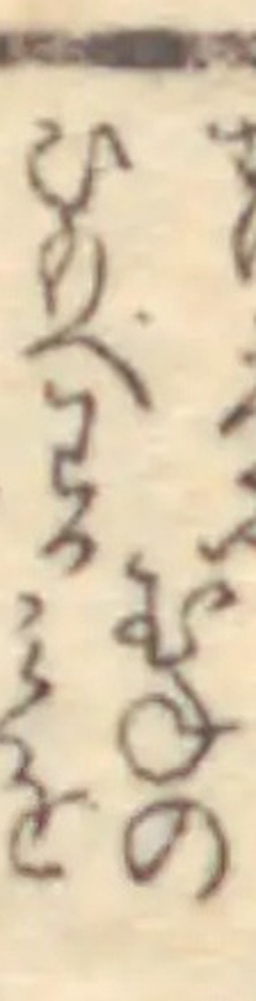ひもへわかみを
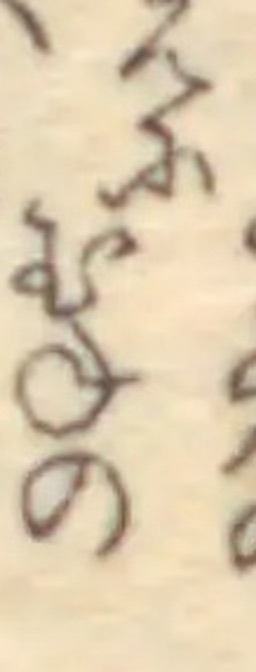むねの
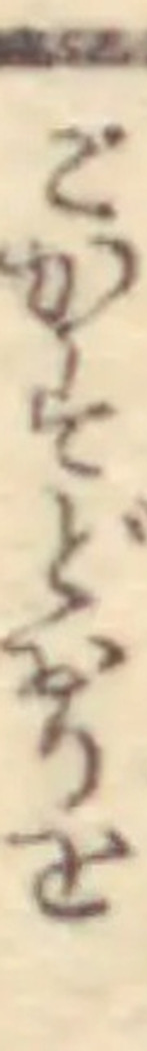こかすどおりを
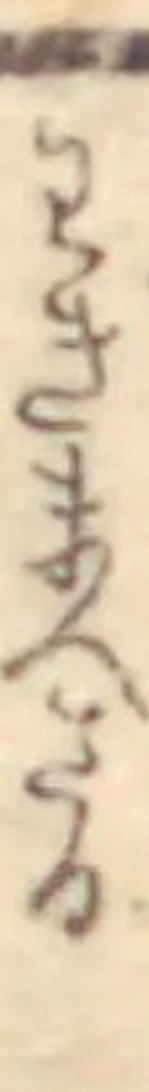わきまへさる
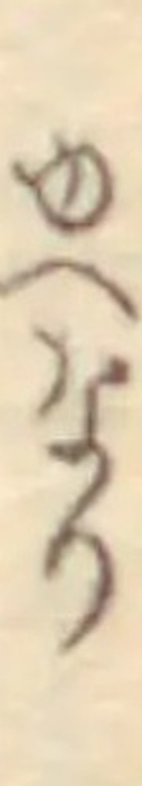ゆへなり
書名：児訓影絵喩 3巻
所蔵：国立国会図書館 National Diet Library, JAPAN
